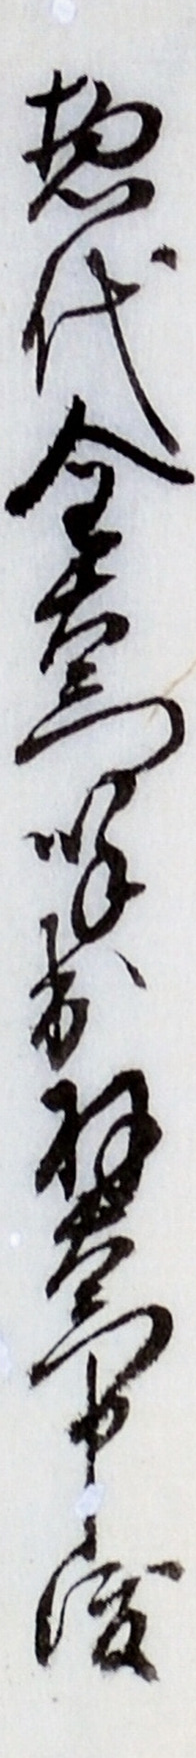惣代金右衛門呼出羽右衛門申渡
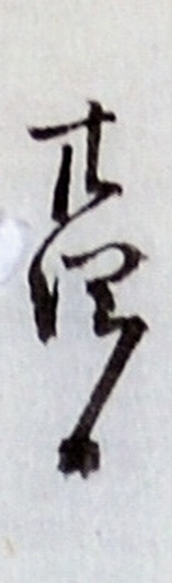廿四日
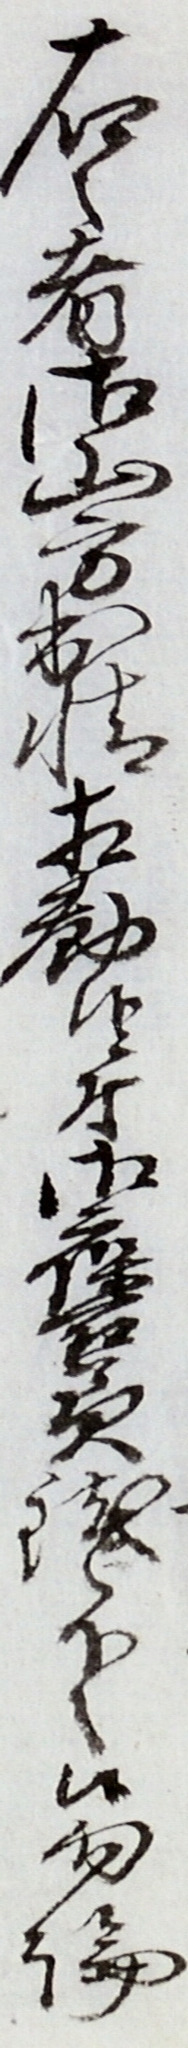右之者御山方書帳相勤候ニ付御褒美銭被下之候勿論
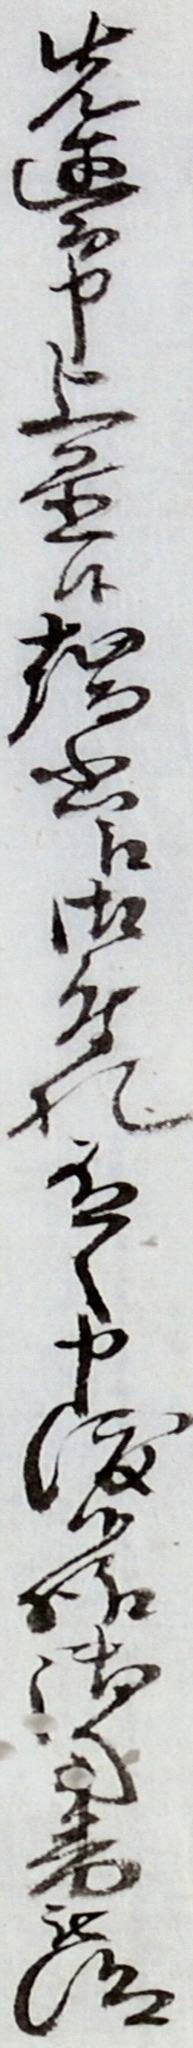先追而申上置候端書江御付札有之申渡候様御用番被仰
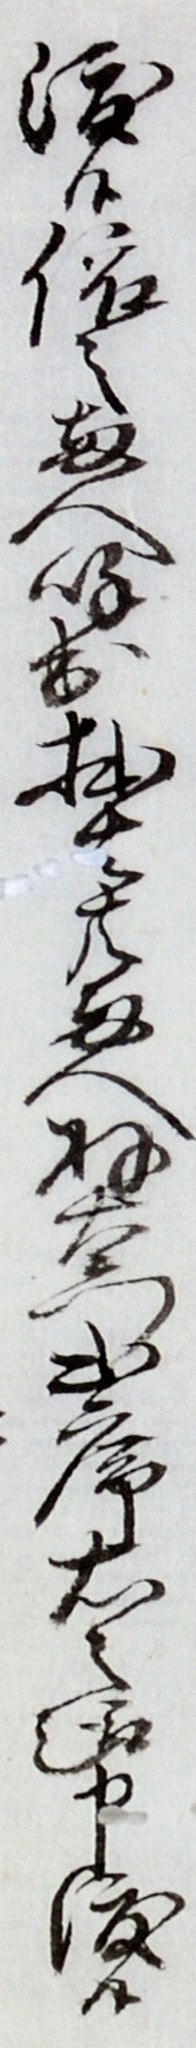渡候依之両人呼出杣共両人羽右衛門出席右之趣申渡候
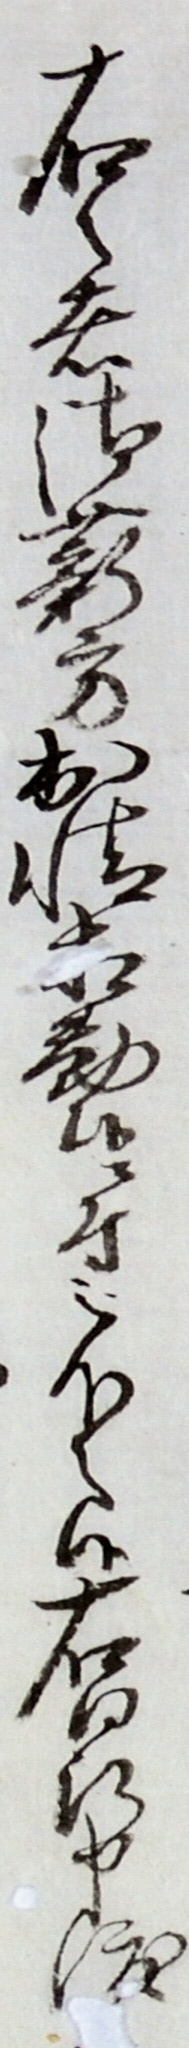右之者御藪方書帳相勤候ニ付被下之候右同断申渡
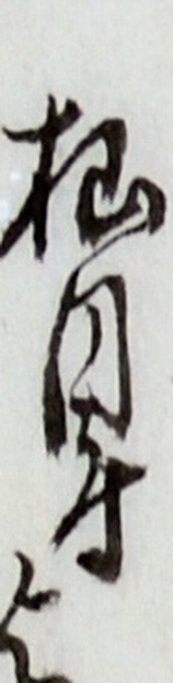杣目付

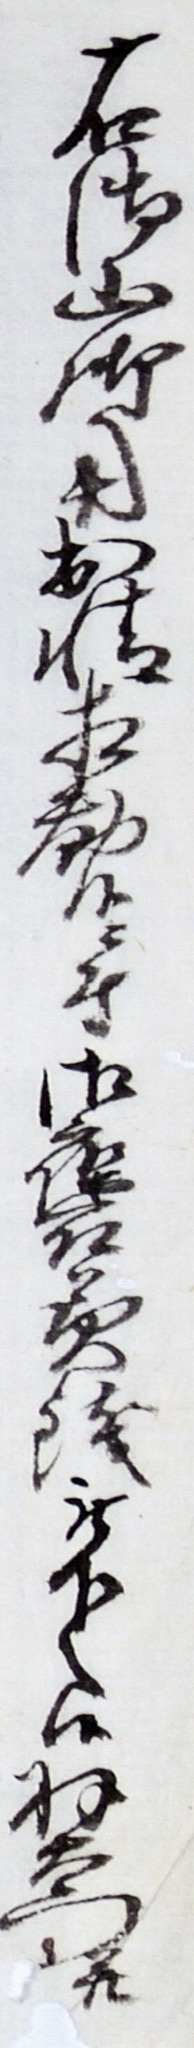右山御用書帳相勤候ニ付御褒美銭被下之候羽右衛門并
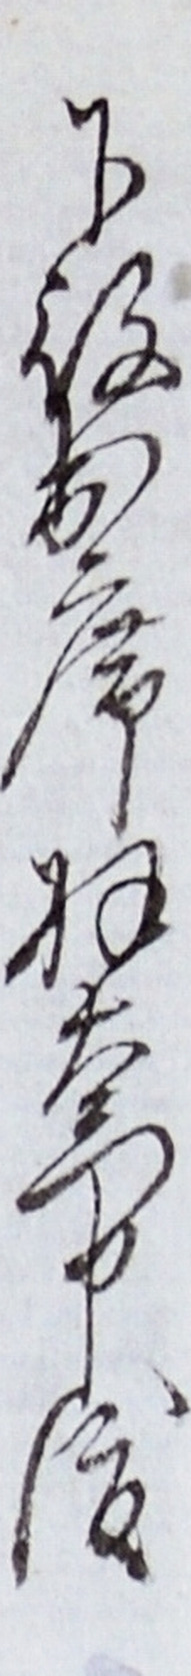下役出席羽右衛門申渡
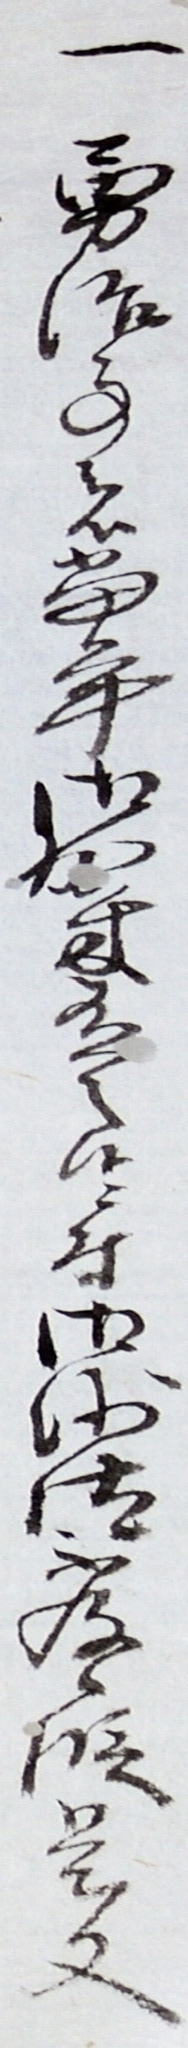一勇治事は当年御加米有之候ニ付御沙汰不及候段是又
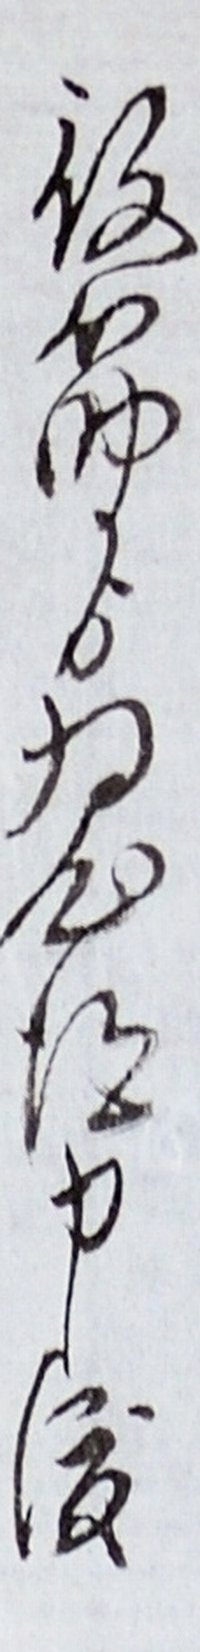役筋より為心得申渡
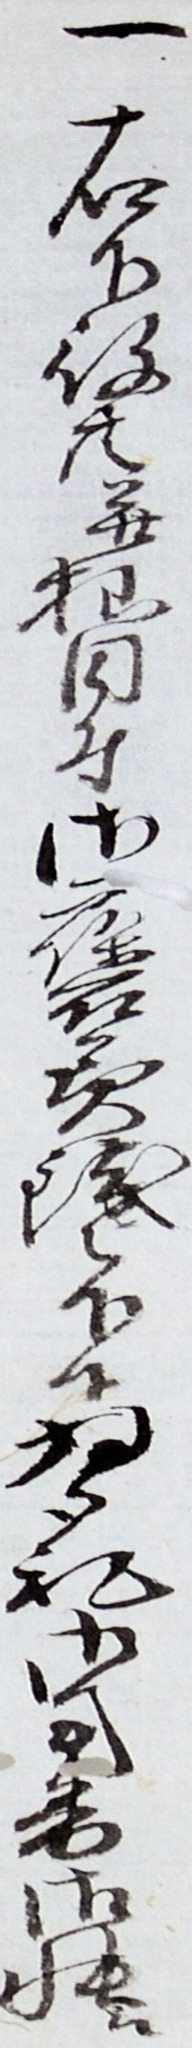一右下役共并杣目付御褒美銭被下候為〆礼御用番御快候
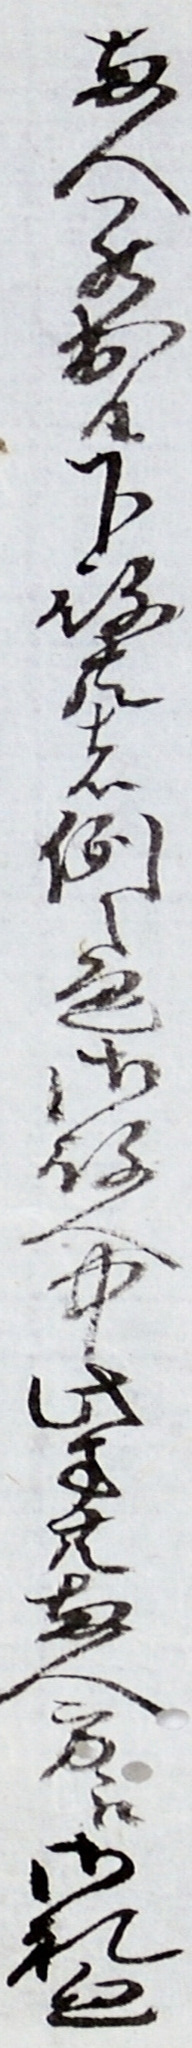両人罷出候下役共者は例之通御役人中此共両人方江御礼廻し
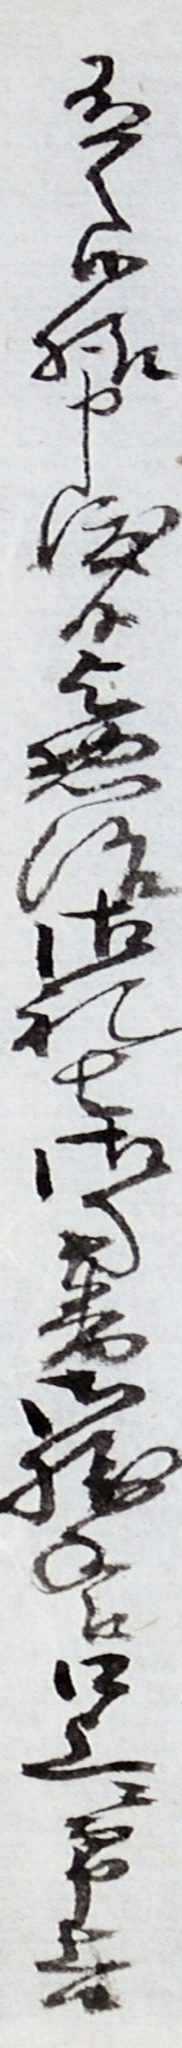有之候様申渡候与惣治御礼は御用番御勝手江口上ニ而申上候
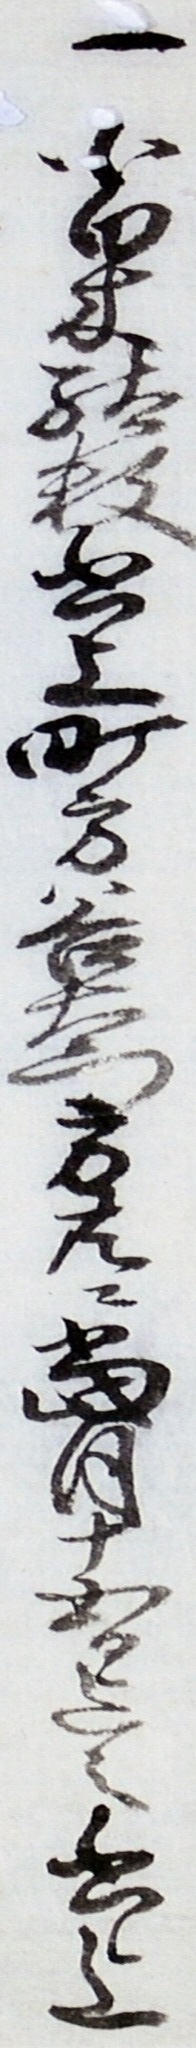一小白木駄数書上町方善右衛門方共ニ当月十五日迄之書上
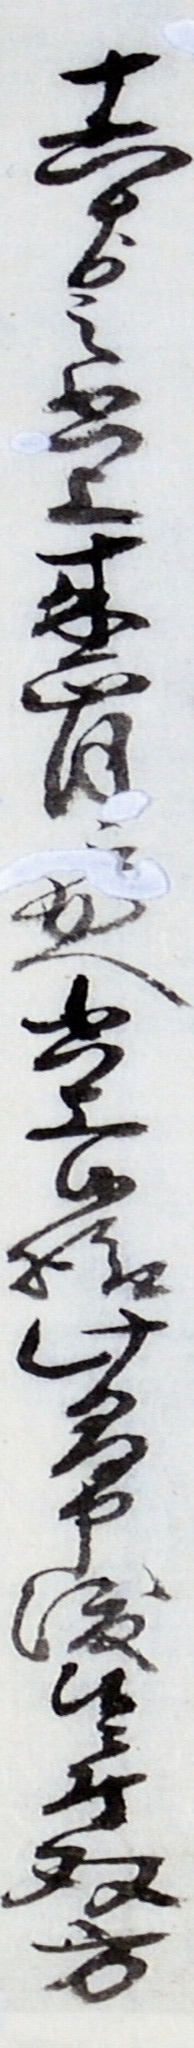十六日より之書上来正月江書上候様此間申渡候ニ付双方
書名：御山奉行御用控
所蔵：伊那市立高遠町図書館・合同会社AMANE
